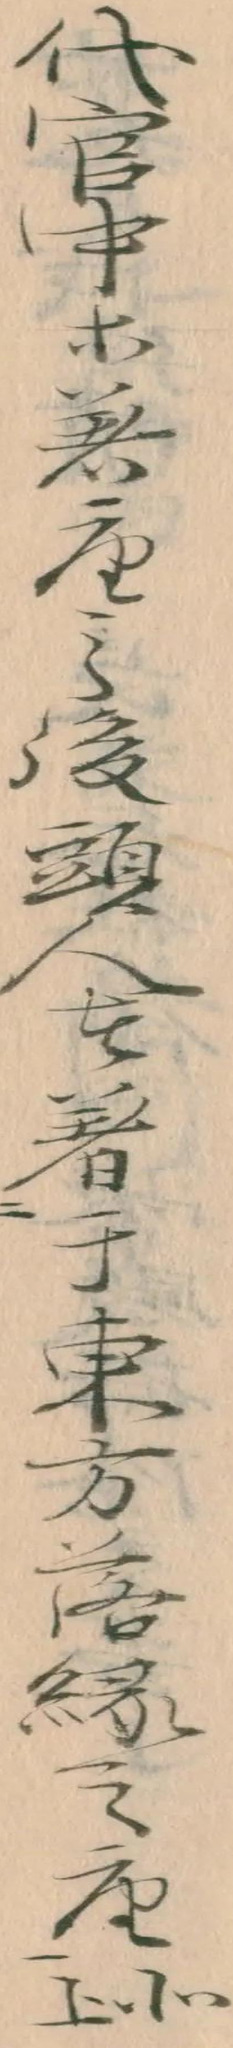代官中等着座之後頭人者着于東方落縁之座北上
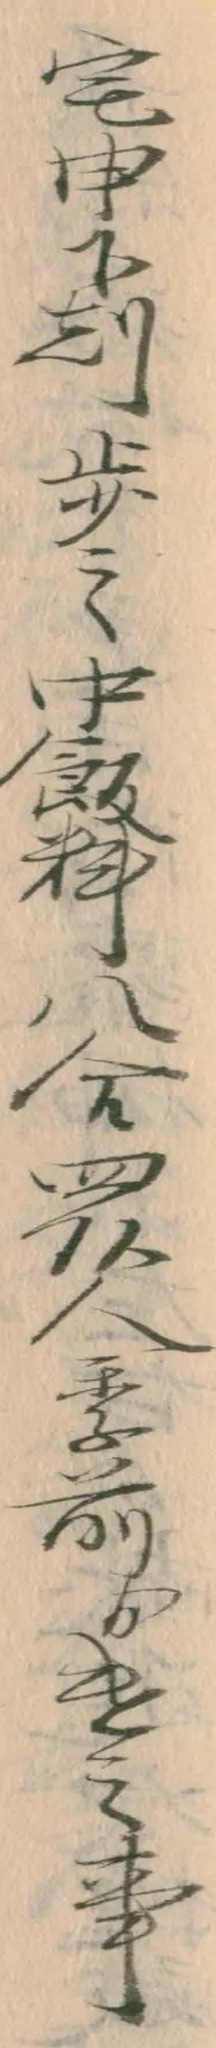宅申下刻歩之中飯料八合四頭人季前ゟ遣之事
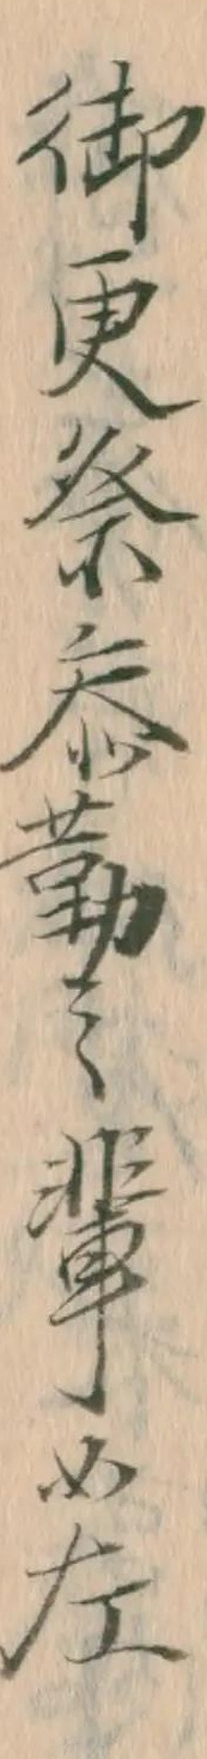御更祭参勤之輩如左
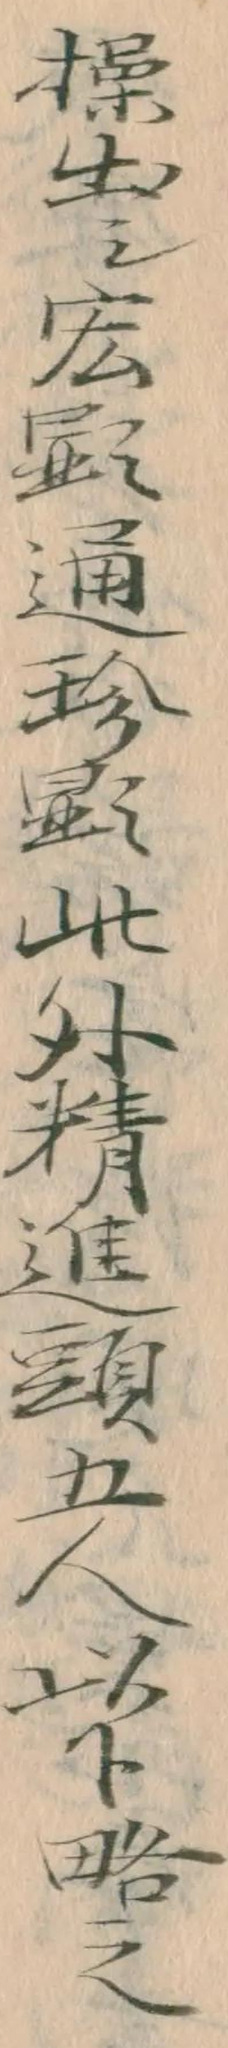操出シ宏顕通珍顕此外精進頭五人以下略之
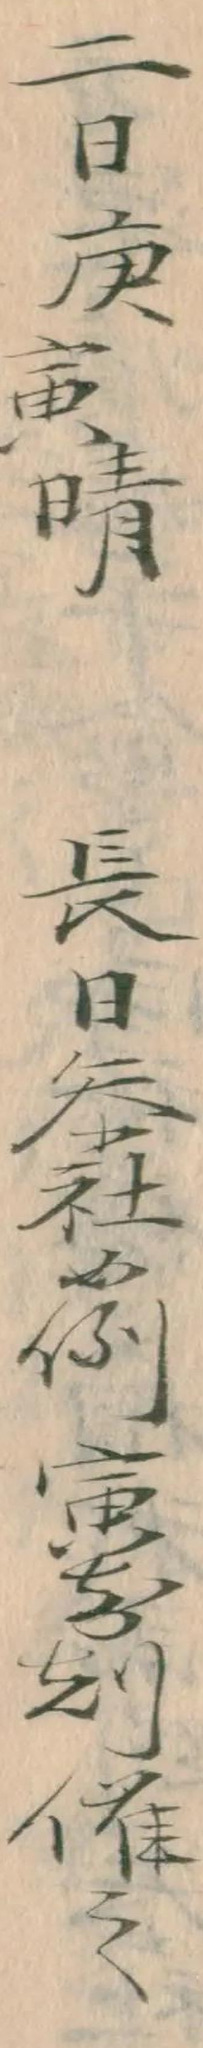二日庚寅晴長日参社如例寅前刻催之
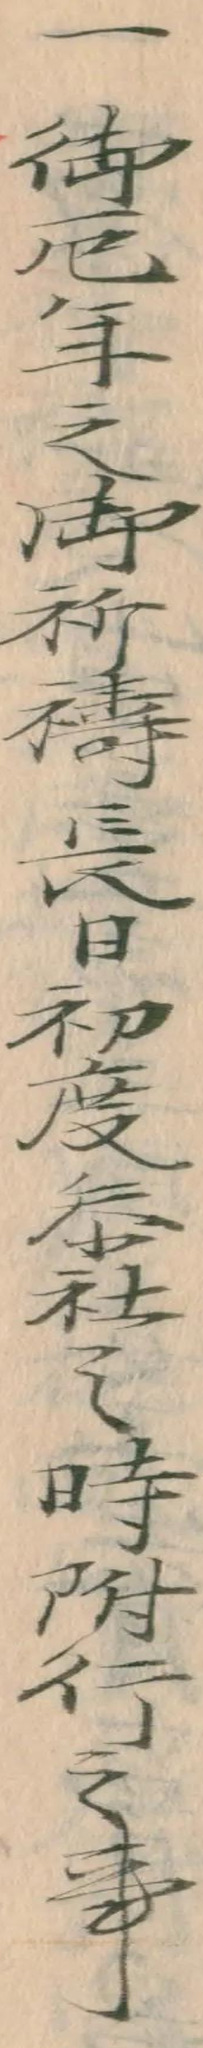一御厄年之御祈祷長日初度参社之時附行之事
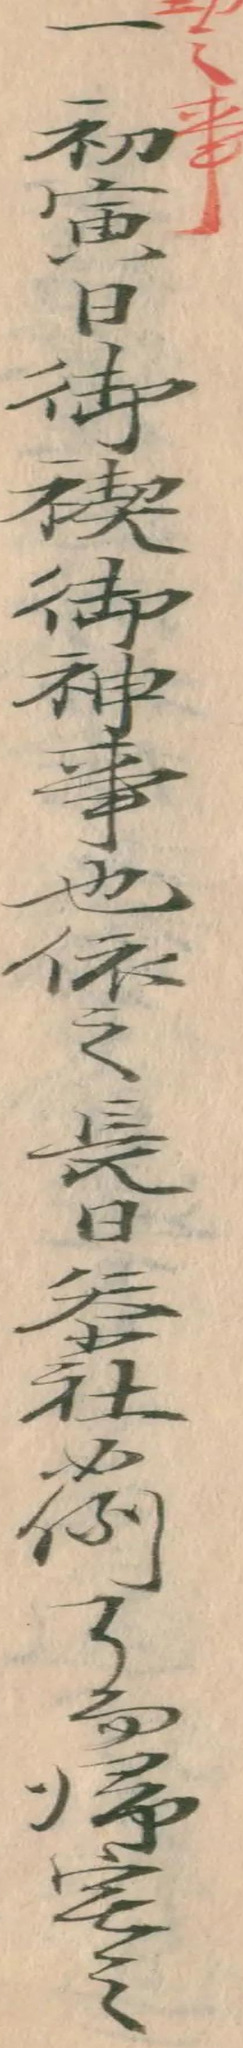一初寅日御御神事也依之長日参社如例了而帰宅之

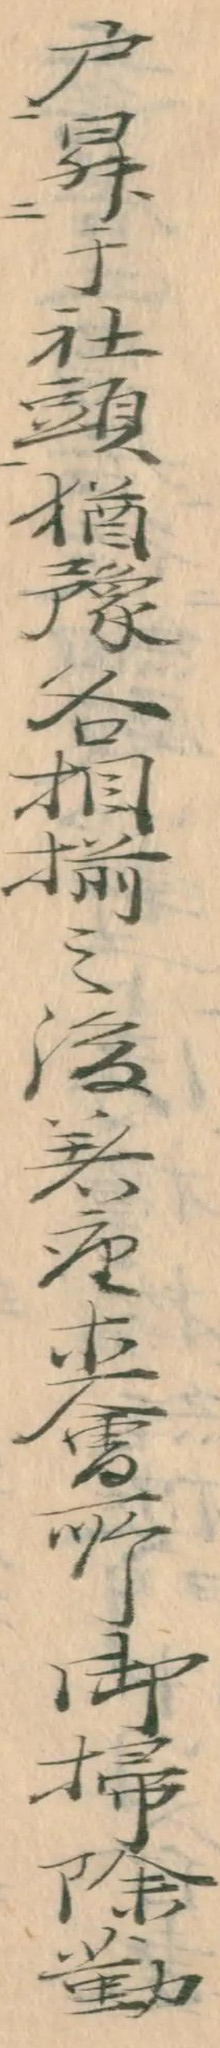戸昇于社頭猶豫各相揃之後寒座直會所御掃除勤
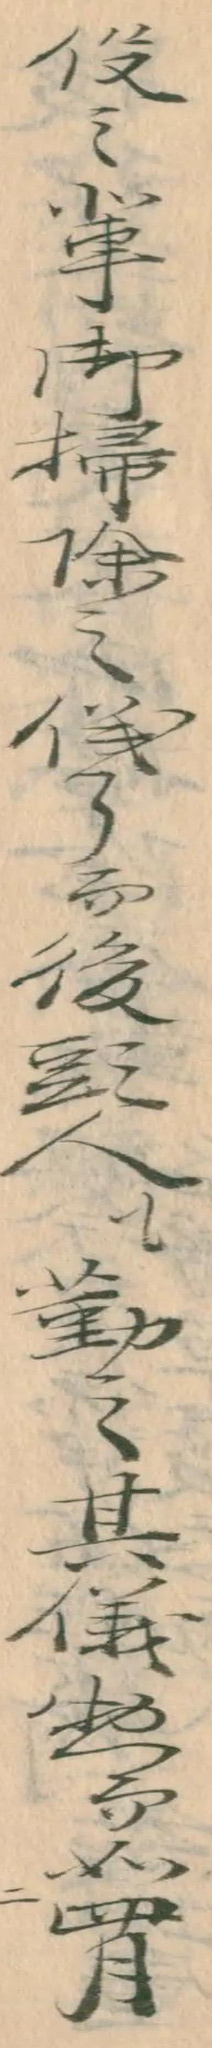役之輩御掃除之儀了而後頭人も勤之其儀惣而如四月
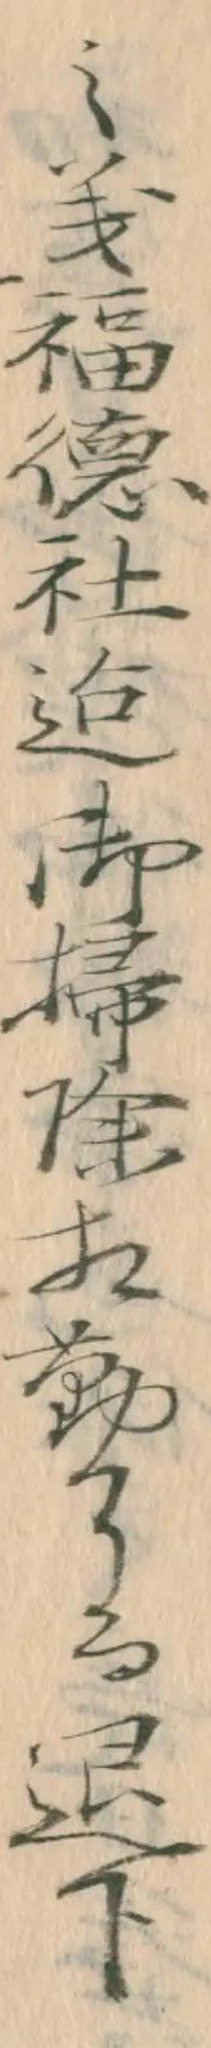之義福徳社迄御掃除相勤了而退下
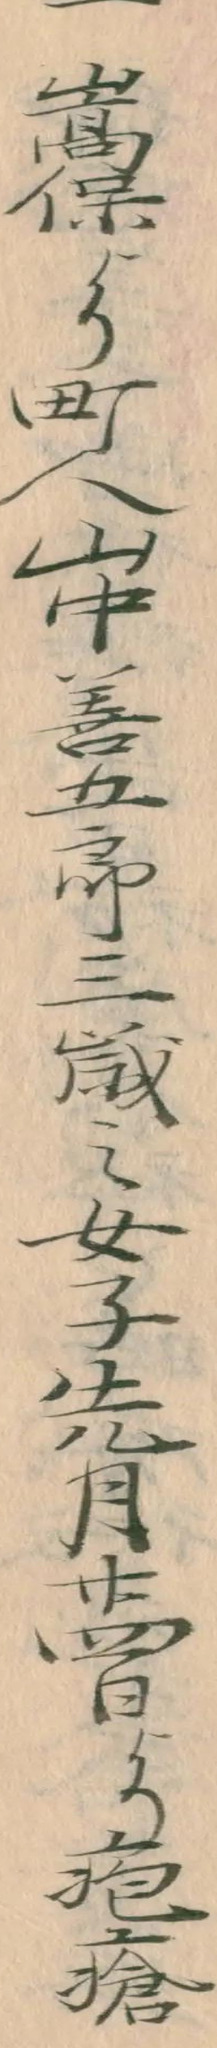一嵩保より町人山中善五郎三歳之女子先月廿四日より疱瘡
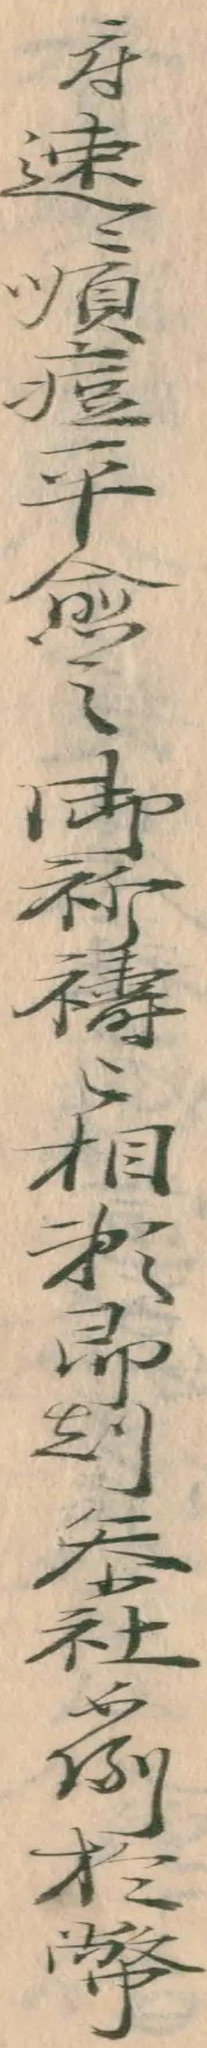ニ付速ニ順痘平愈之御祈祷被相頼即刻参社如例於幣
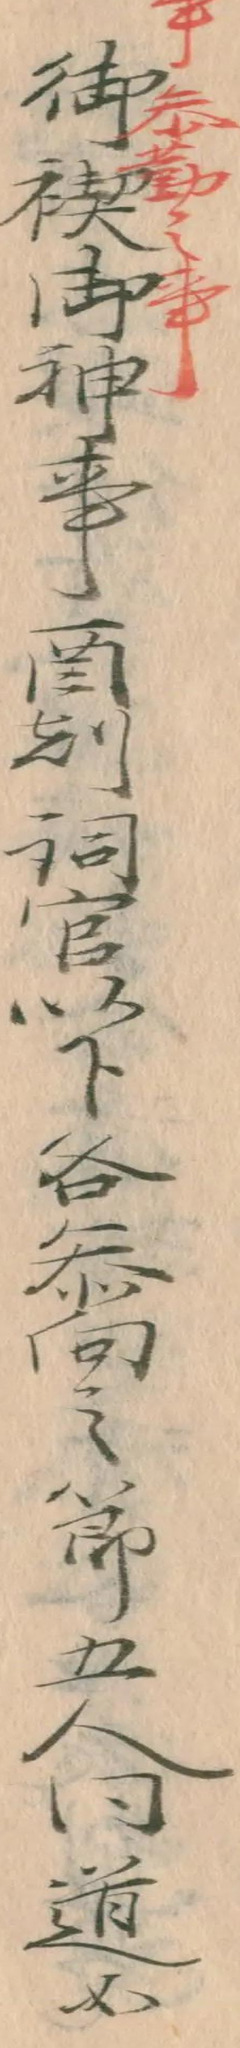一御禊御神事酉刻祠官以下各参向之節五人同道如
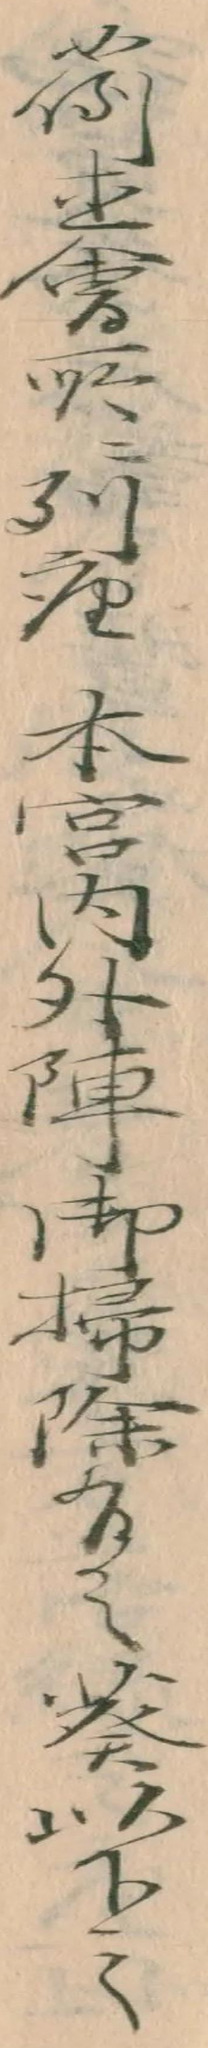如例直會所ニ列座本宮内外陣御掃除有之葵以下之
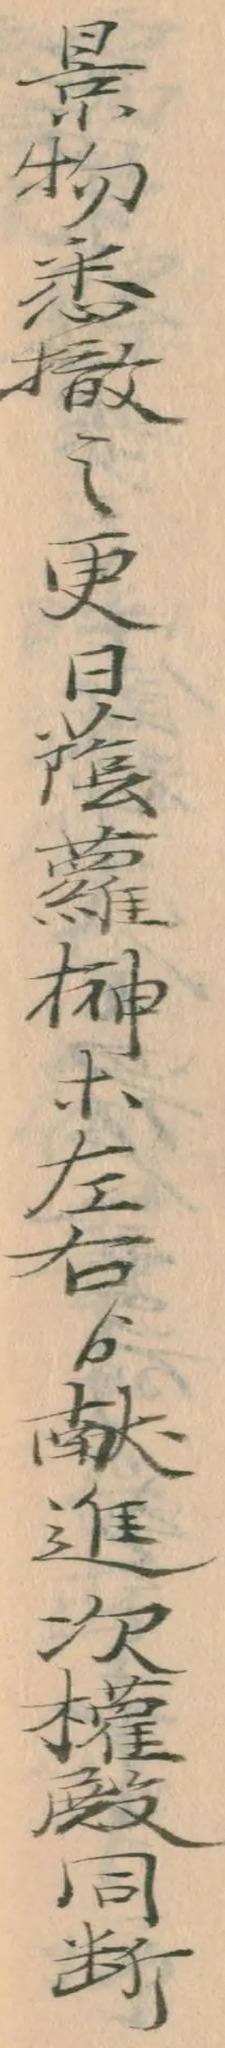景物悉撤之更日蔭蘿榊等左右ゟ献進次権殿同断
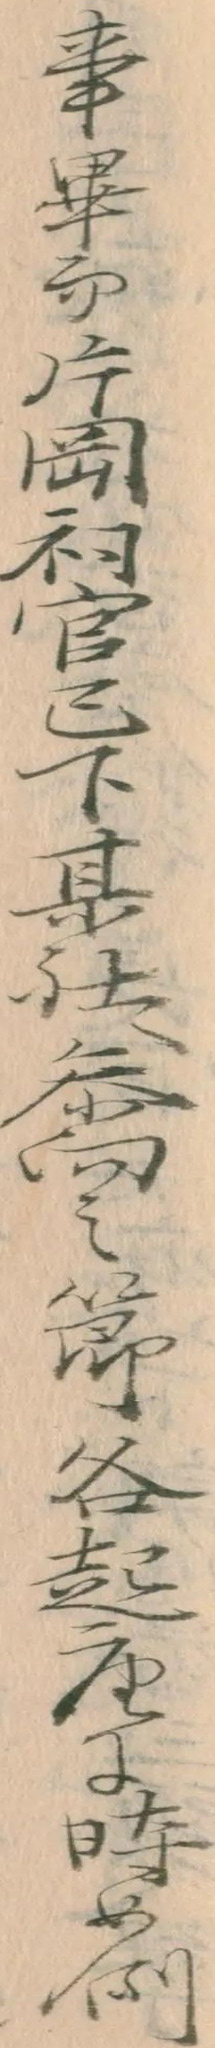事畢而片岡祠官已下某社へ参向之節各起座于時如例
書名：賀茂社記録. 第74冊
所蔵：国立国会図書館 National Diet Library, JAPAN
